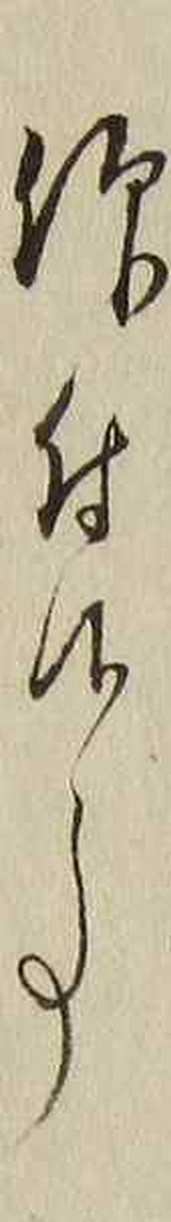仰付候事
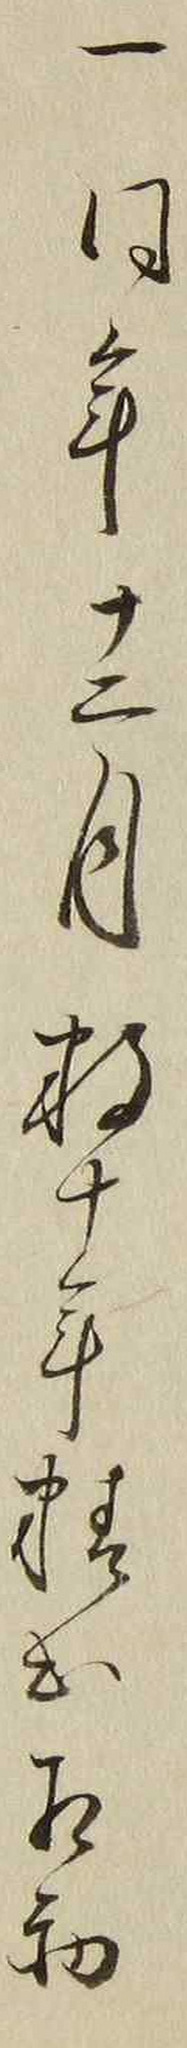一同年十二月数十年精出相勤
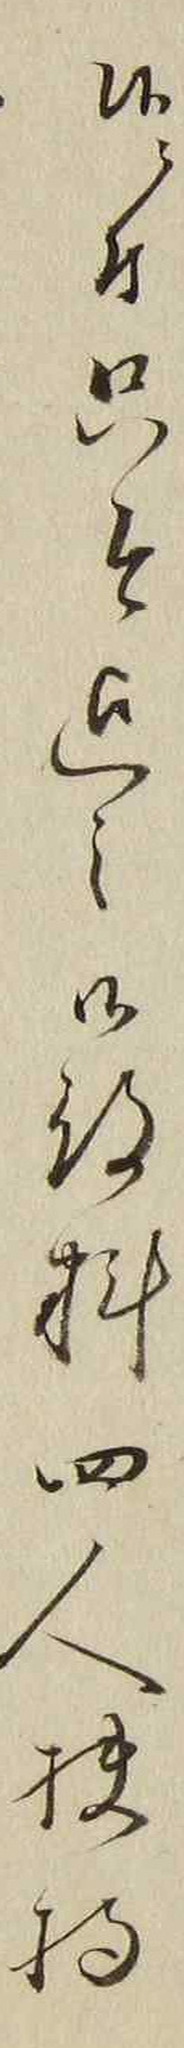候ニ付只今迄之御役料四人扶持
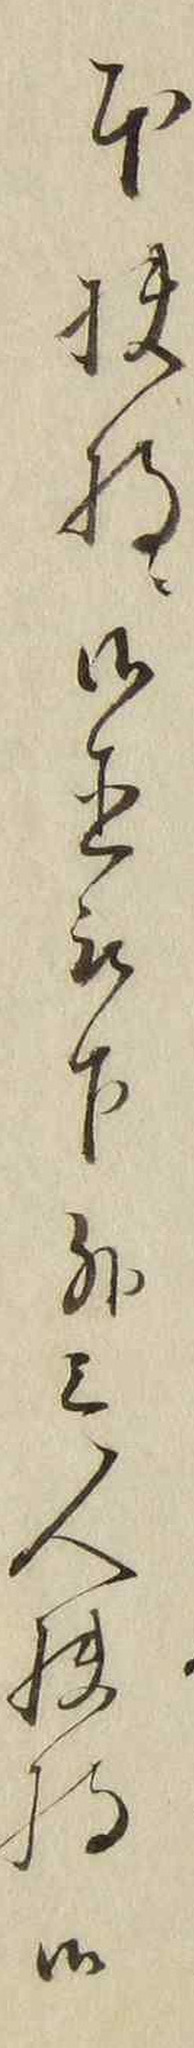本扶持ニ御置被下外三人扶持御
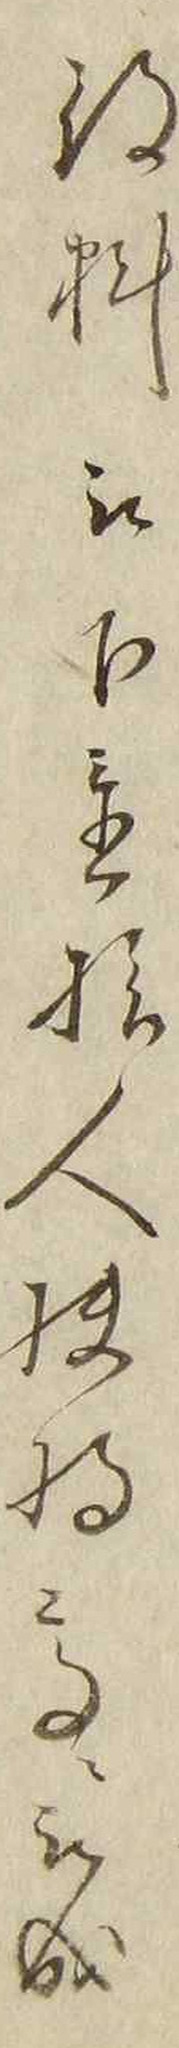役料被下置拾人扶持高ニ被成

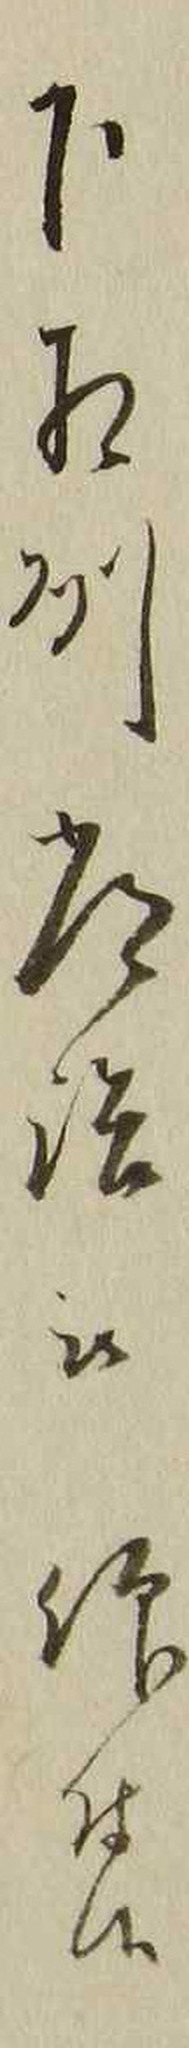下相州常詰被仰付候
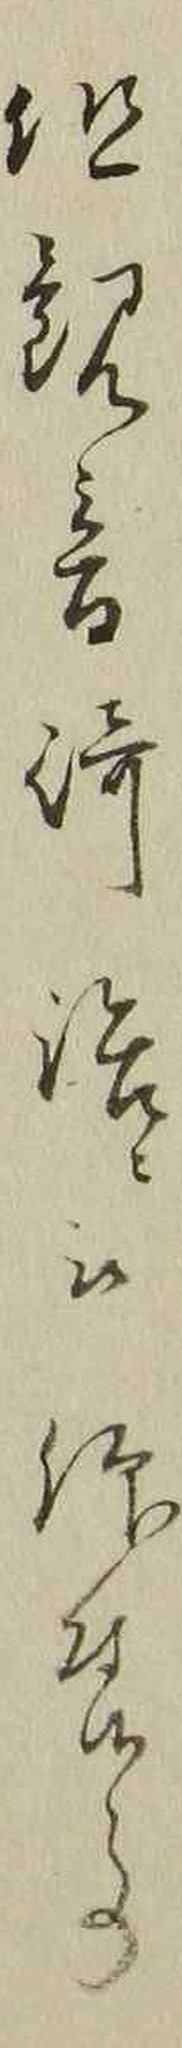但観音崎詰ニ被仰付候事
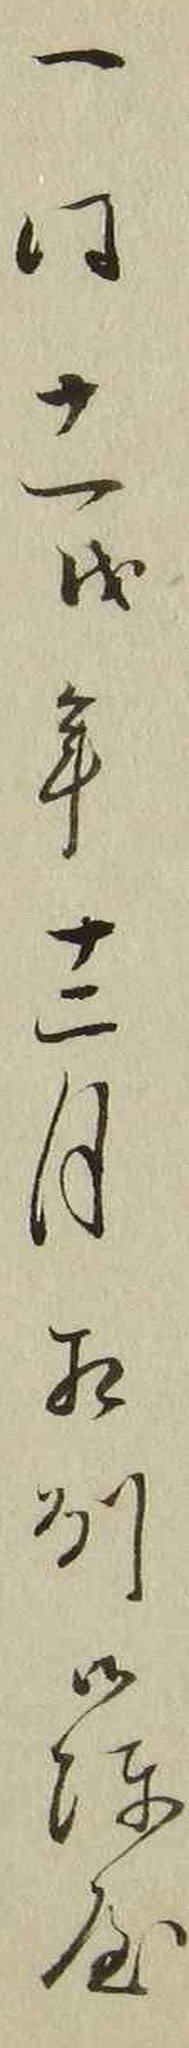一同十一戌年十二月相州御陣屋
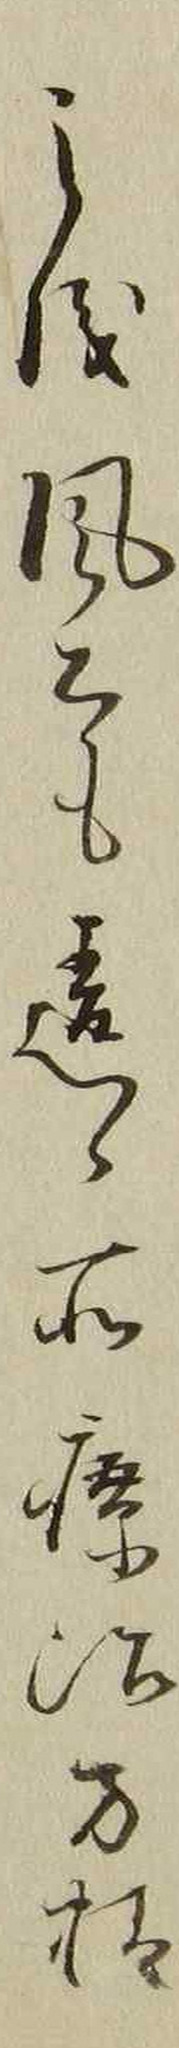之儀風とも違候所療治方精
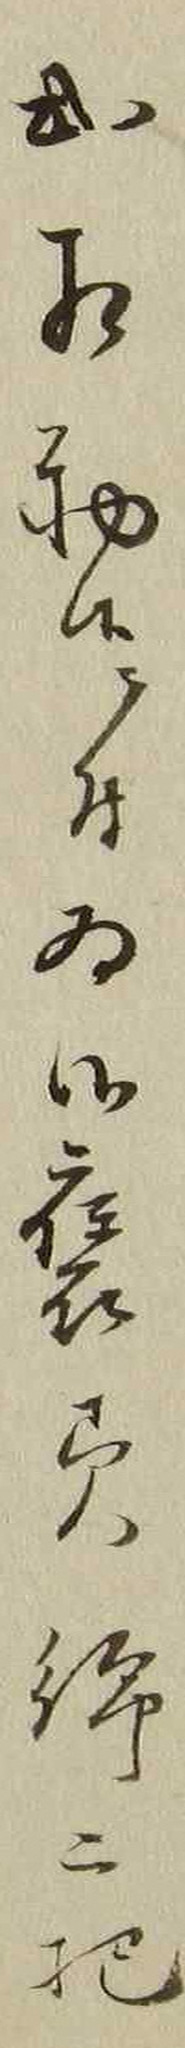出相勤候ニ付為御褒美綿二把
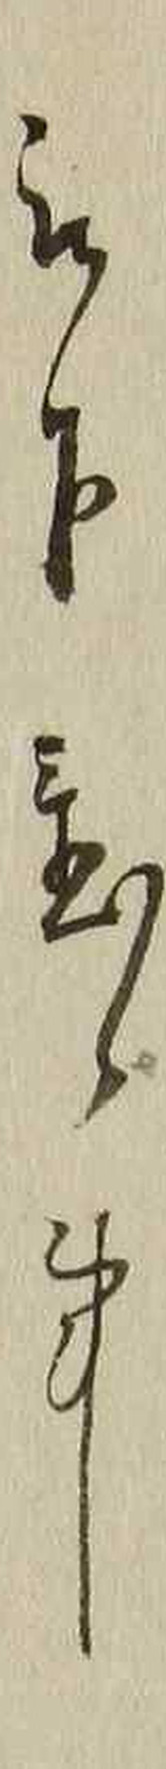被下置候事
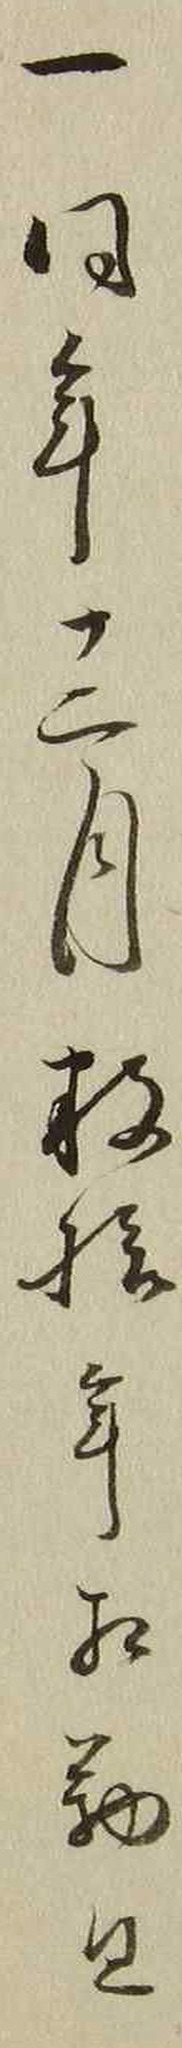一同年十二月数拾年相勤且
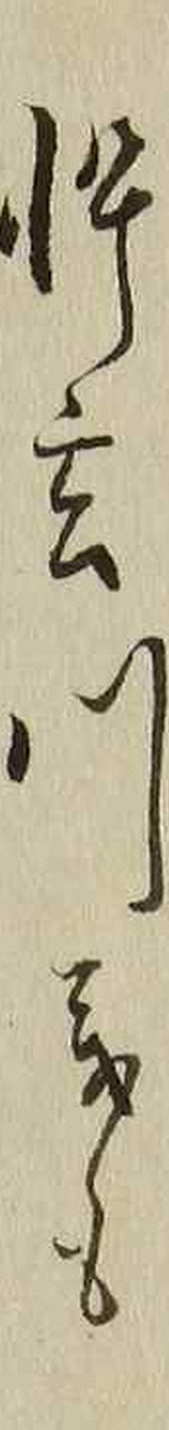忰玄川義も
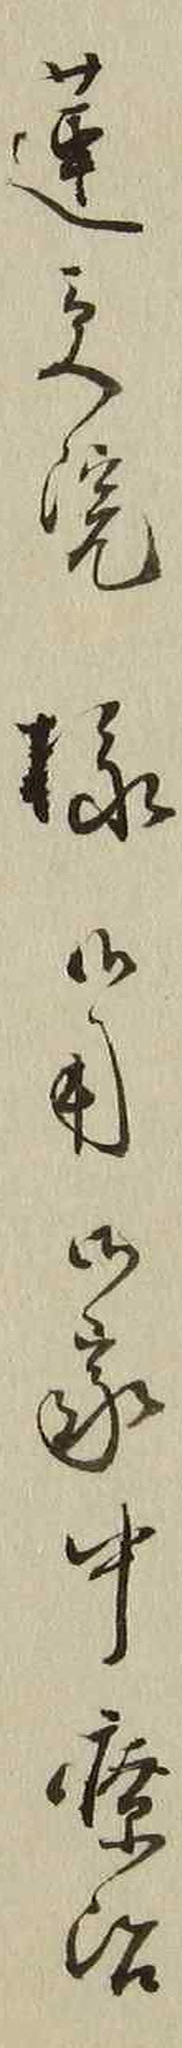蓮受院様御用御家中療治
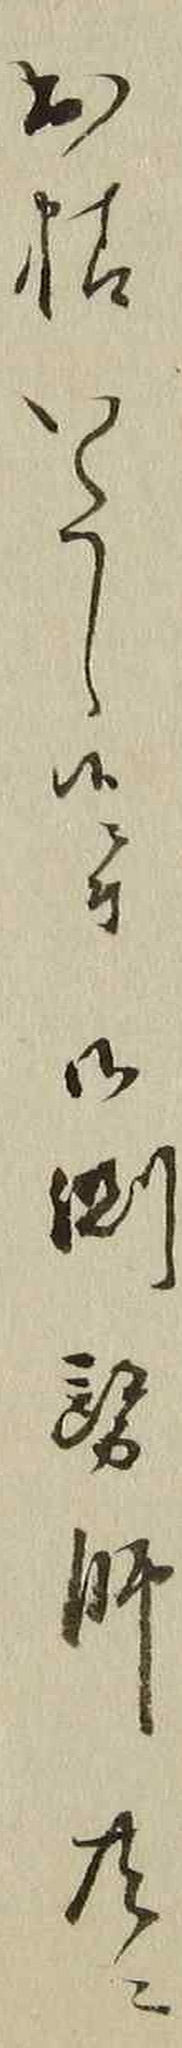出精いたし候ニ付御側医師共ニ
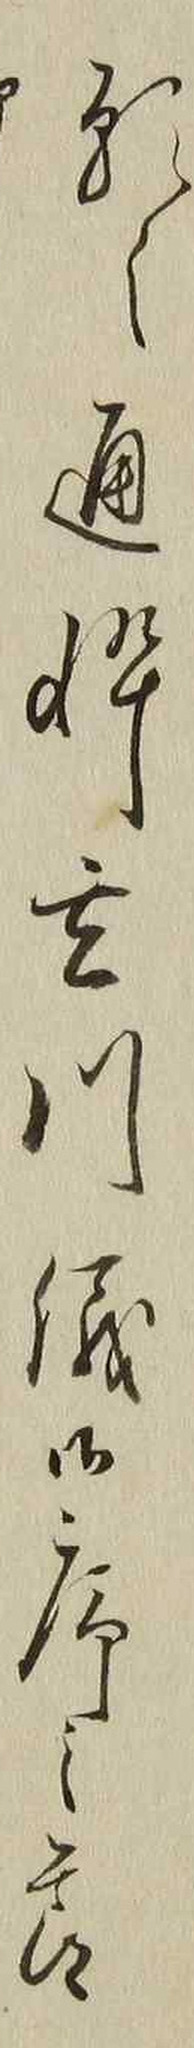願之通忰玄川儀御序之節
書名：諸士系譜　巻之129　た之部5
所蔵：会津若松市立会津図書館
